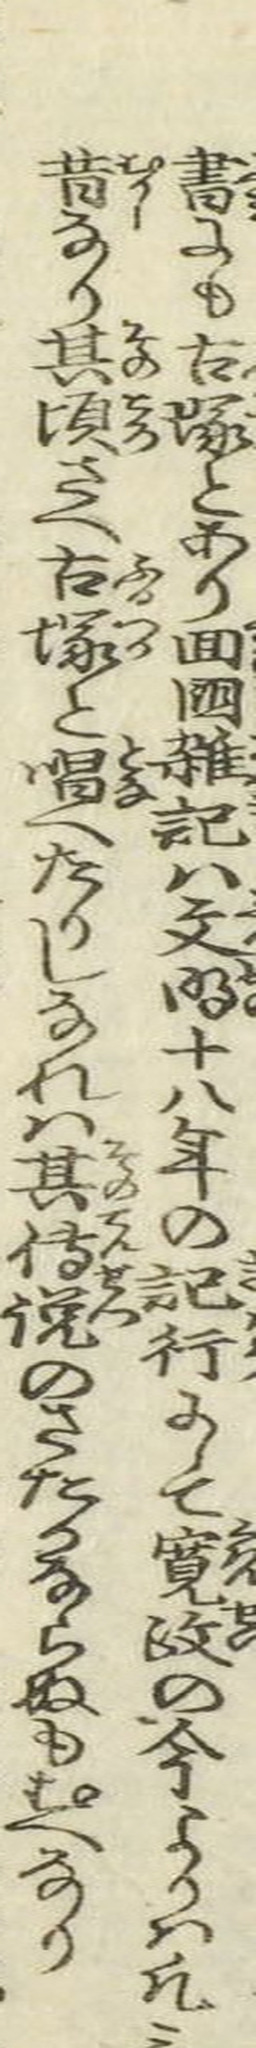昔なり其頃さへ古塚と唱へたりしなれは其伝説のさたかならぬもむへなり
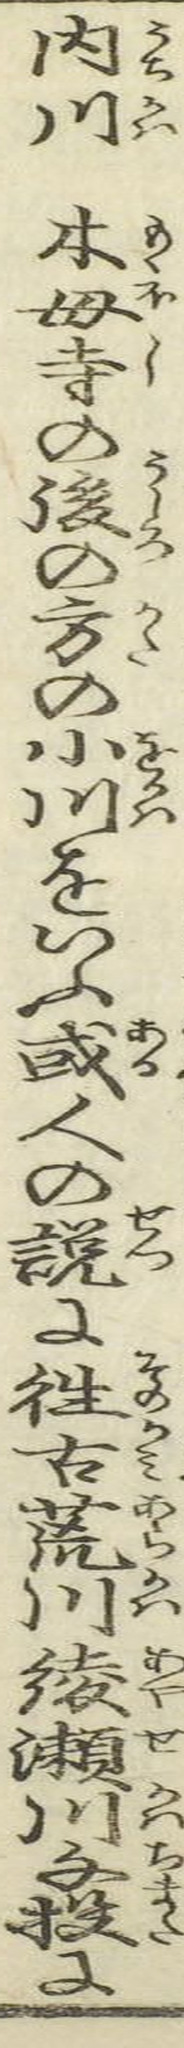内川木母寺の後の方の小川をいふ或人の説に往古荒川綾瀬川千股に
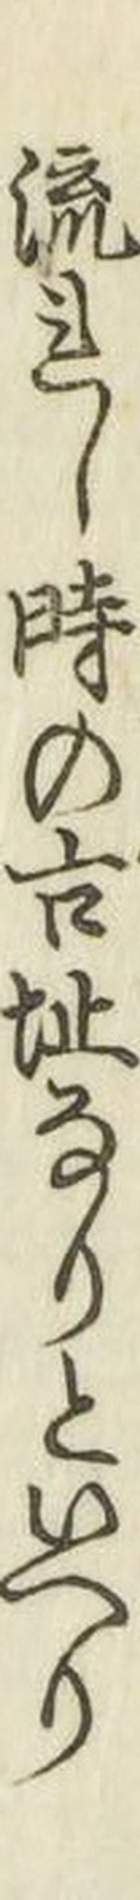流れし時の古址なりといへり
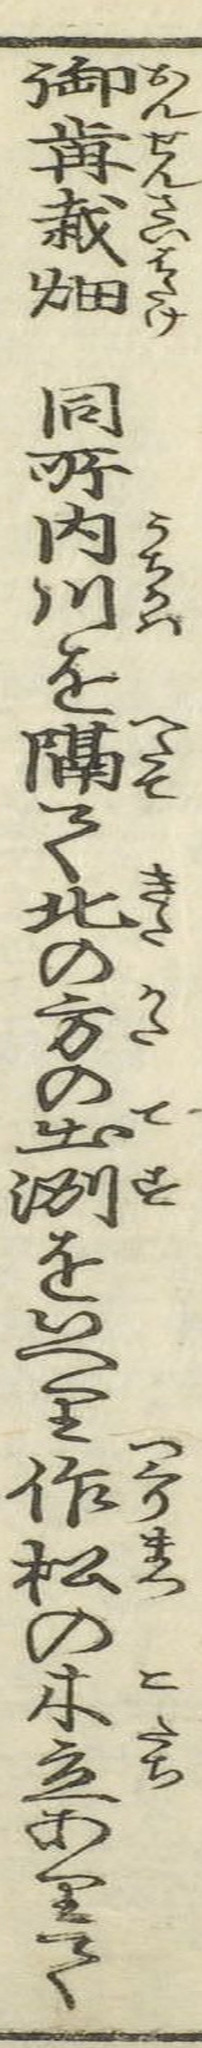御栽畑同所内川を隔て北の方の出洲をいへり作松の木立ありて
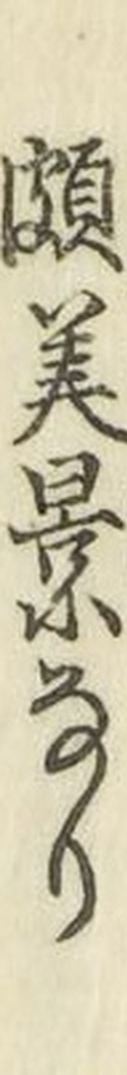頗美景なり
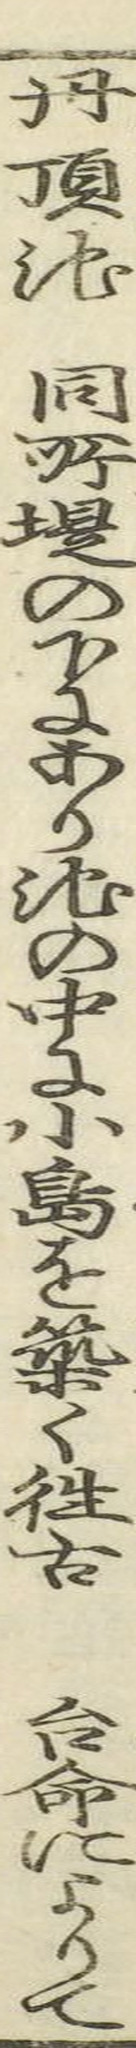丹頂池同所堤の下にあり池の中に小島を築く往古台命によりて
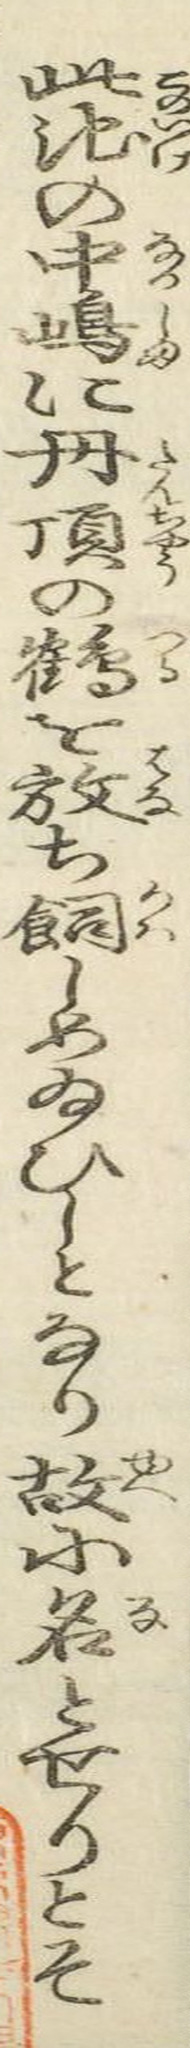此池の中島に丹頂の鶴を放ち飼しめ給ひしとなり故に名とせりとそ
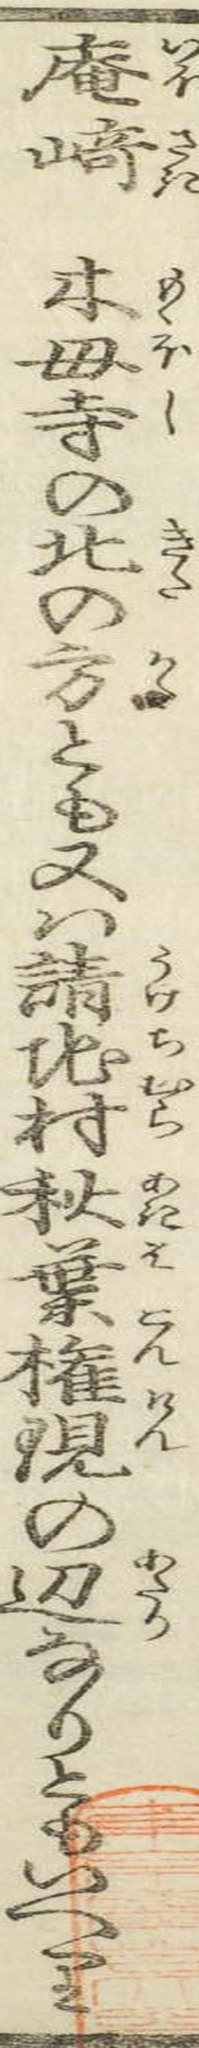庵崎木母寺の北の方とも又は請地村秋葉権現の辺なりともいへり
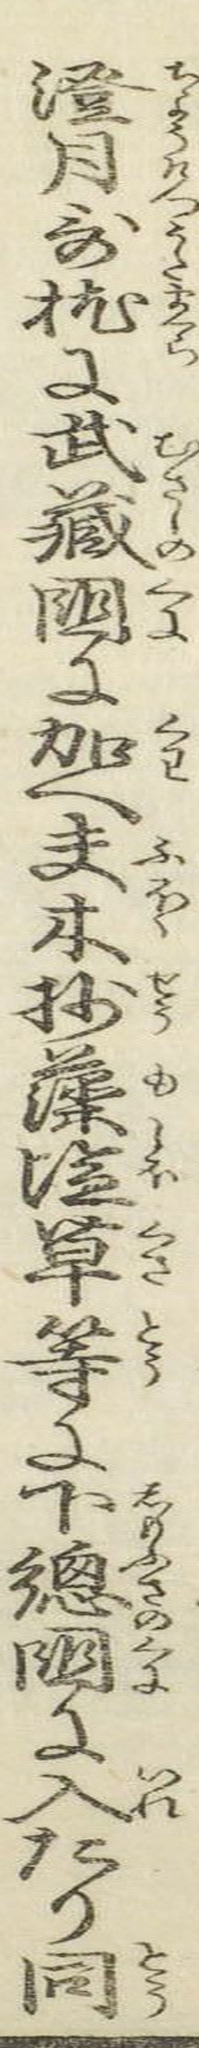澄月歌枕に武蔵国に加へ夫木抄藻塩草等に下総国に入たり同
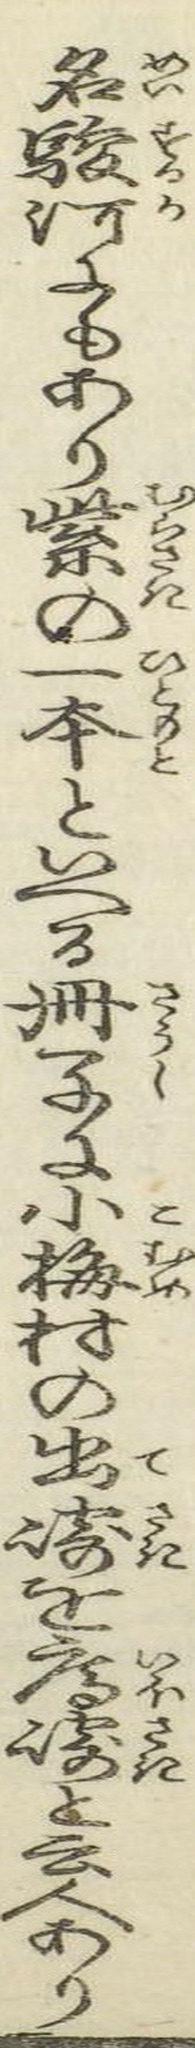名駿河にもあり紫の一本といへる冊子に小梅村の出崎を庵崎と云人あり
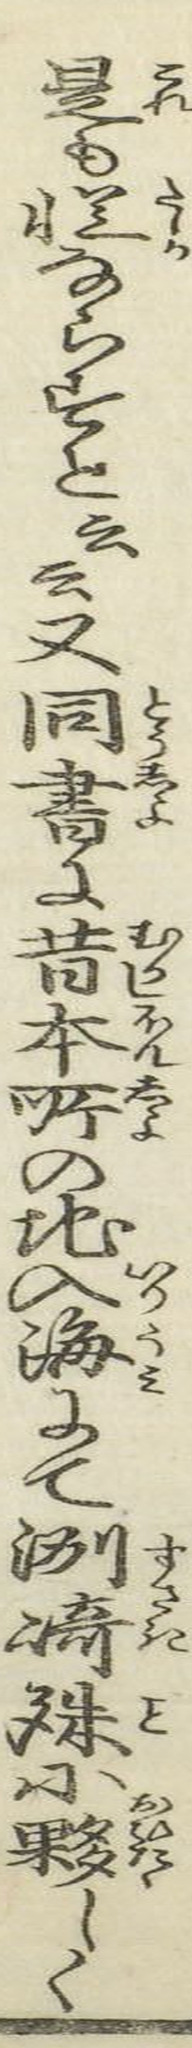是も慥ならすと云々又同書に昔本所の地入海にて洲崎殊に夥しく
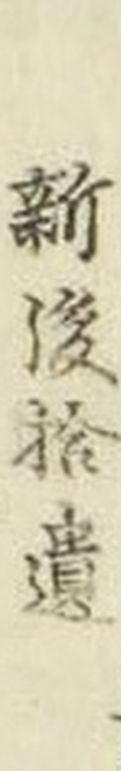新後拾遺
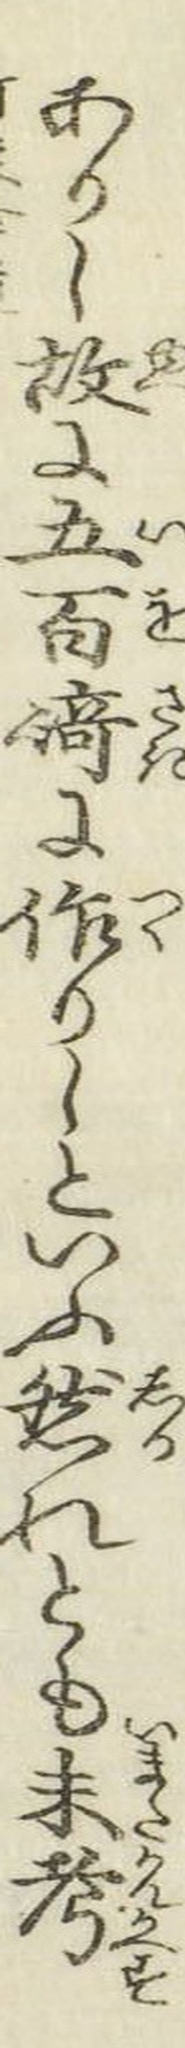ありし故五百崎に作りしといふ然れとも未考
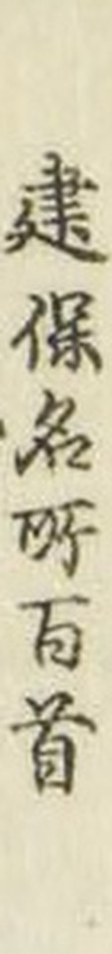建保名所百首
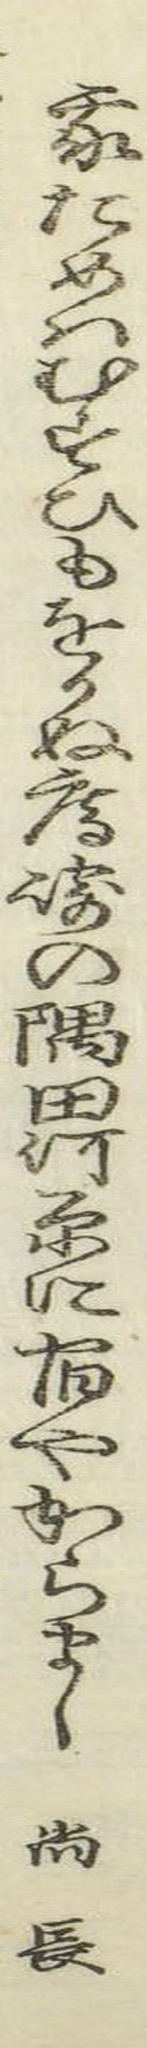我ためはむすひもをかぬ庵崎の隅田河原に宿やからまし尚長
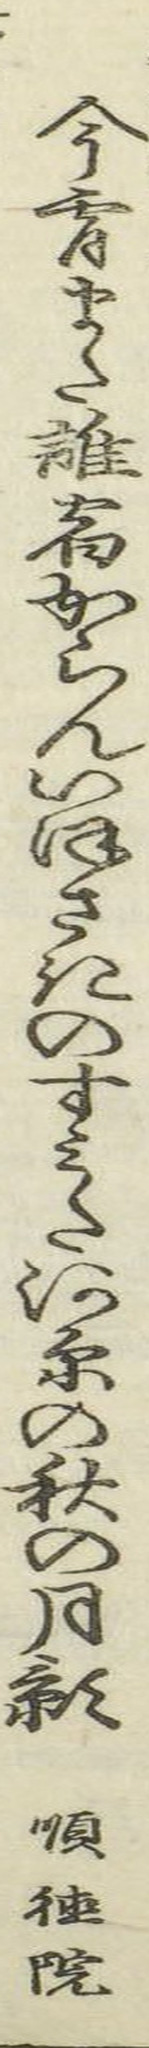今宵また誰宿からんいほさきのすみた河原の秋の月影順徳院
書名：江戸名所図会 20巻 巻之19
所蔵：東京学芸大学教育コンテンツアーカイブ
